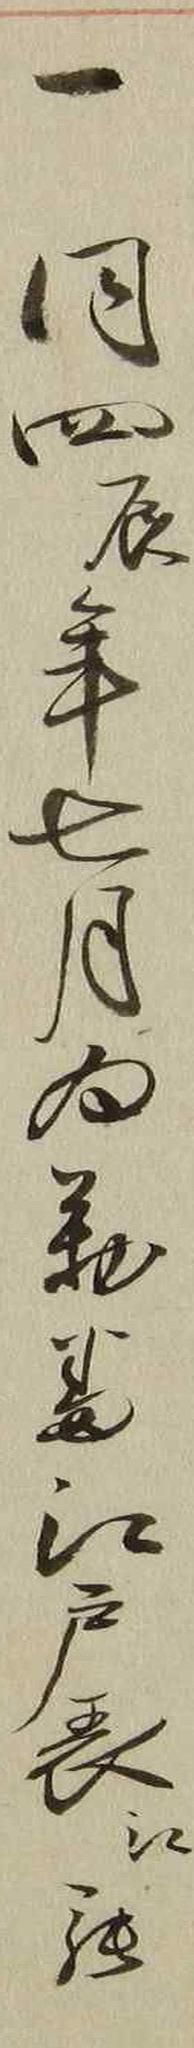一同四辰年七月為勤番江戸表江罷
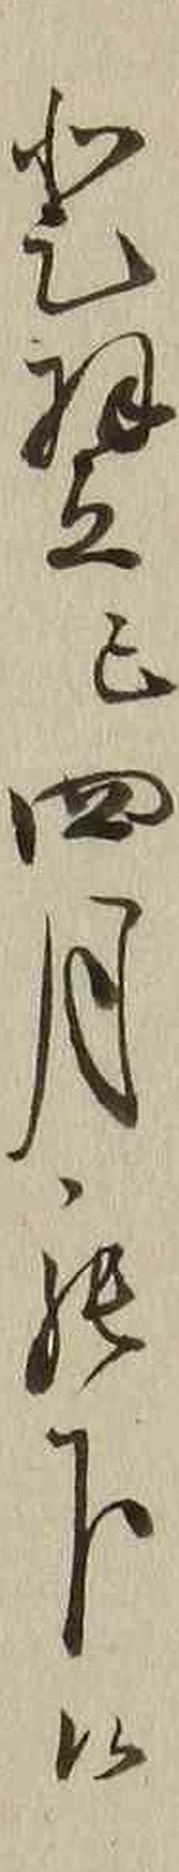登翌巳四月罷下候
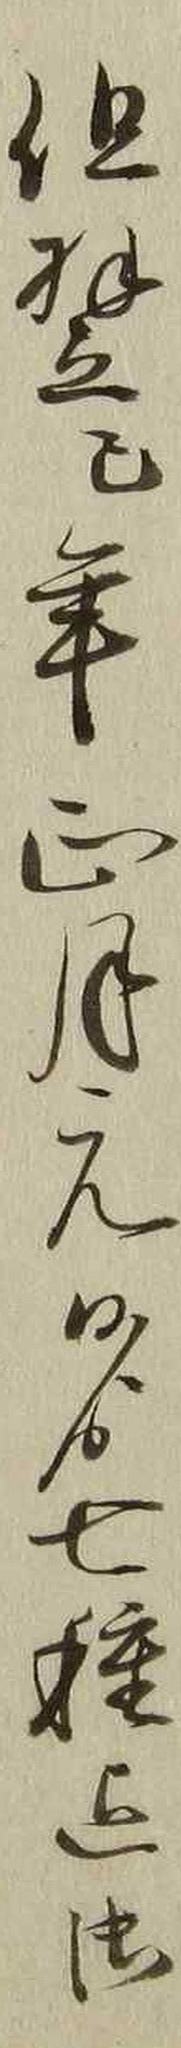但翌巳年正月元日ゟ七種迄御
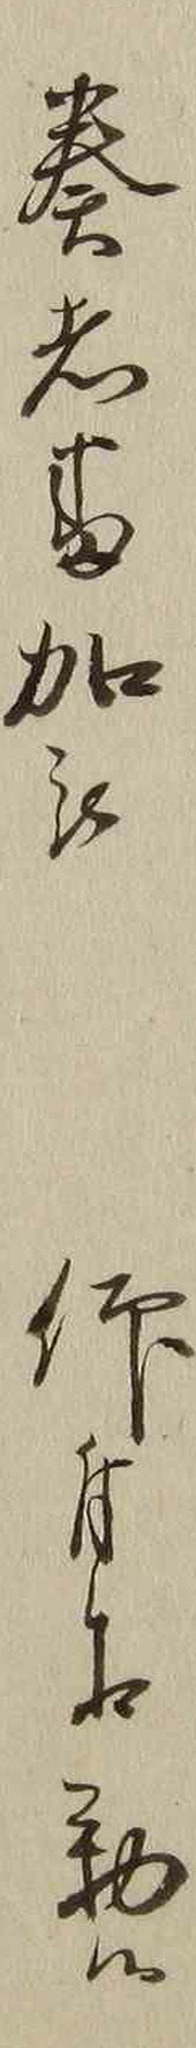奏者番加被仰付相勤候
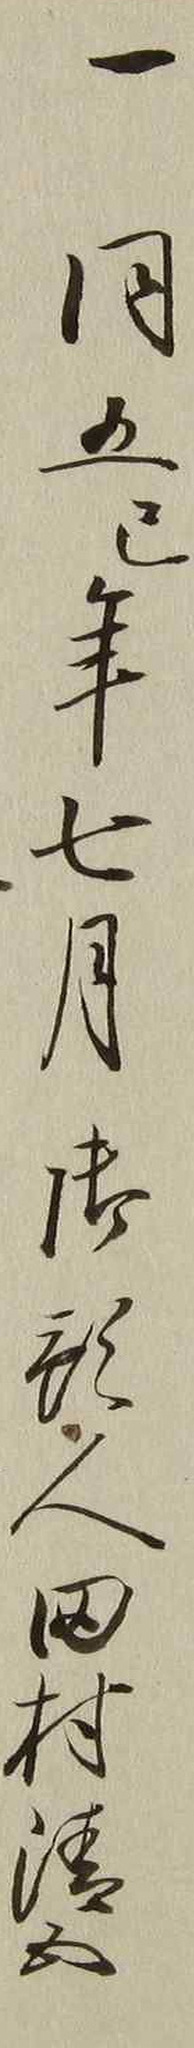一同五巳年七月御預人田村清五
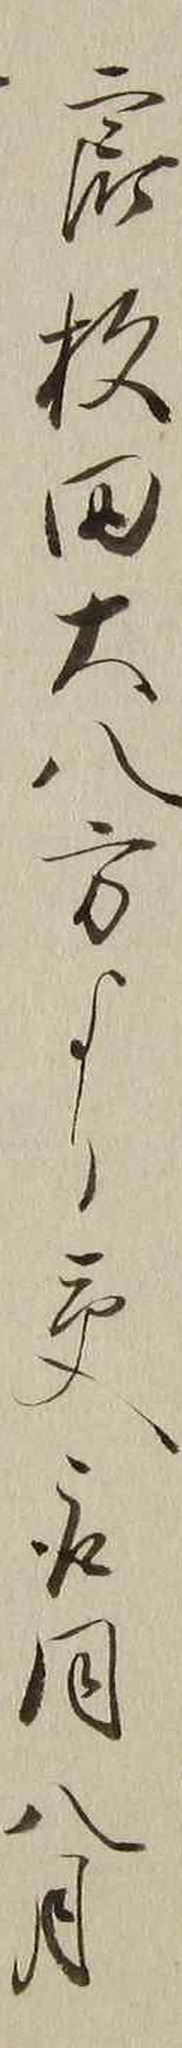郎杉田大八方より受取同八月
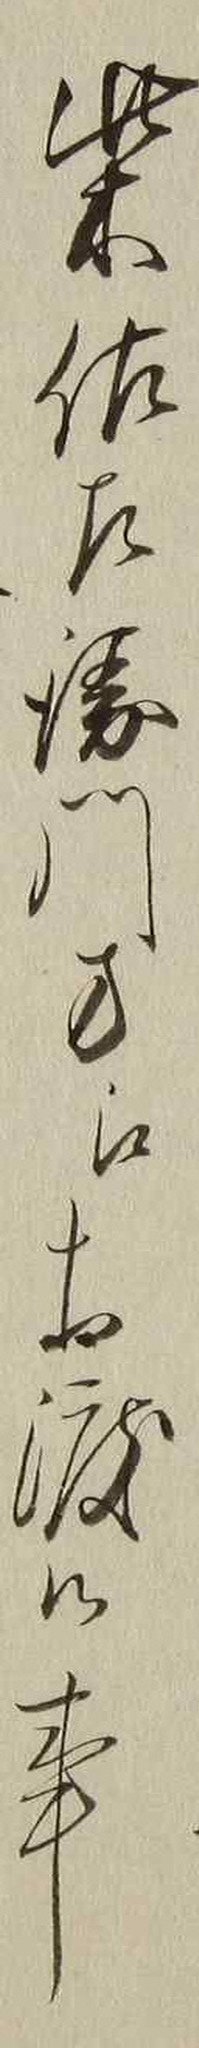柴佐左衛門方江相渡候事
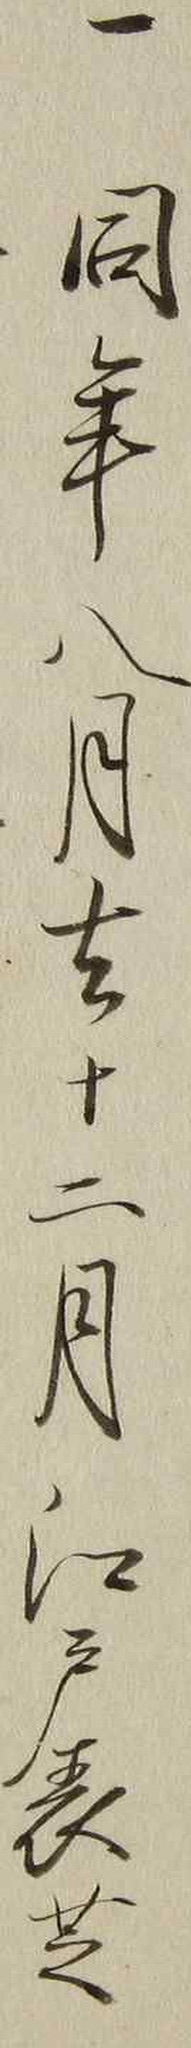一同年八月去十二月江戸表芝
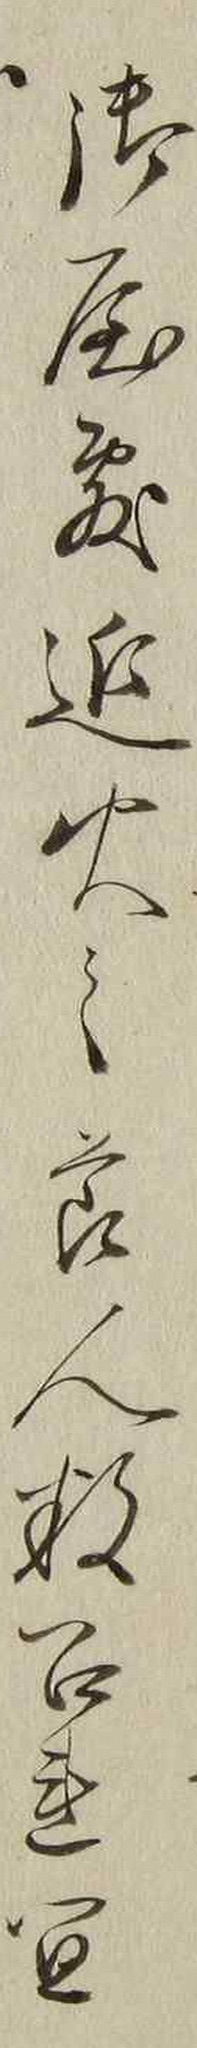御屋敷近火之節人数召連宜
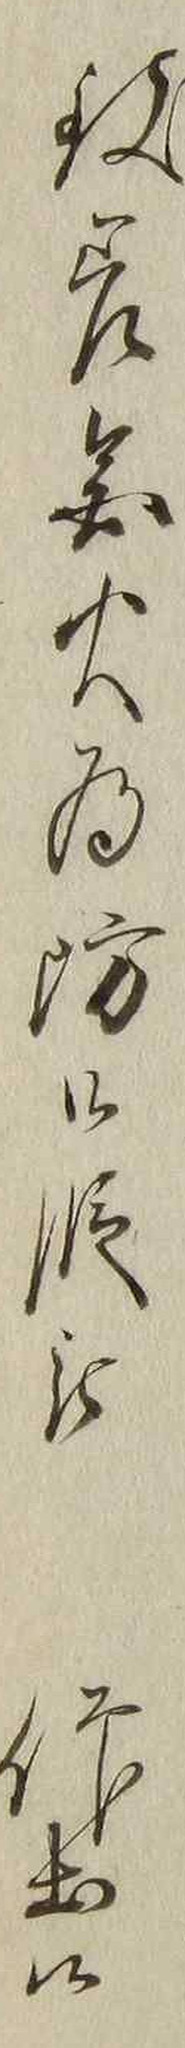致差図火為防候段被仰出候
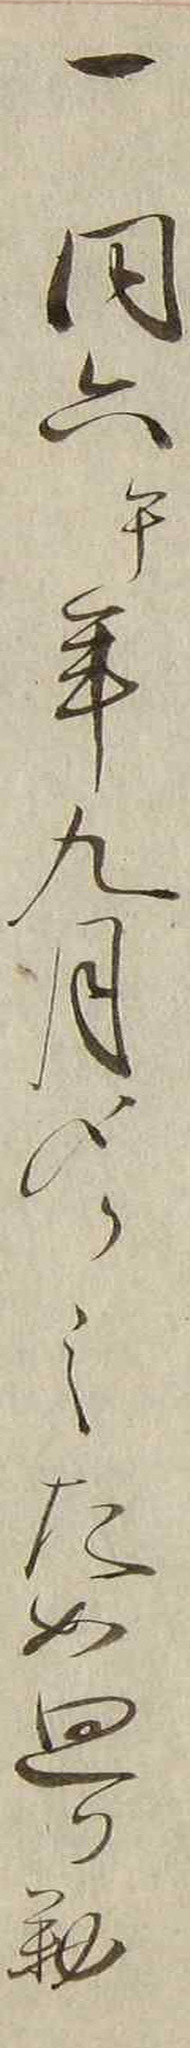一同六午年九月〆り之ため廻勤
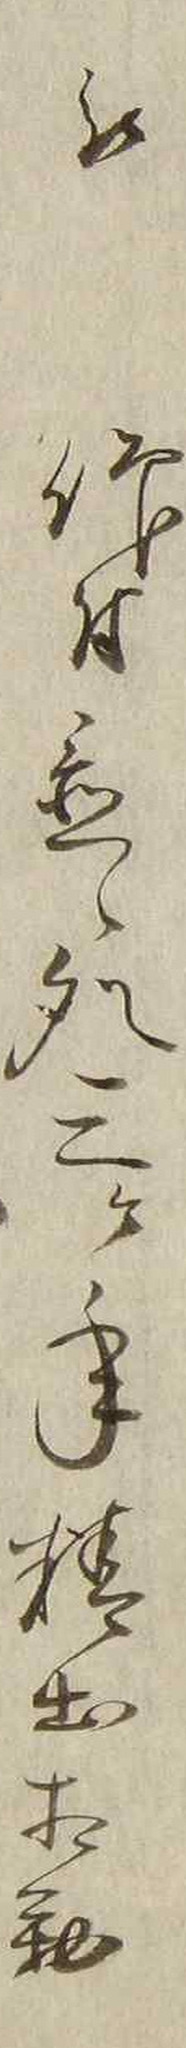被仰付置候処三ヶ年精出相勤
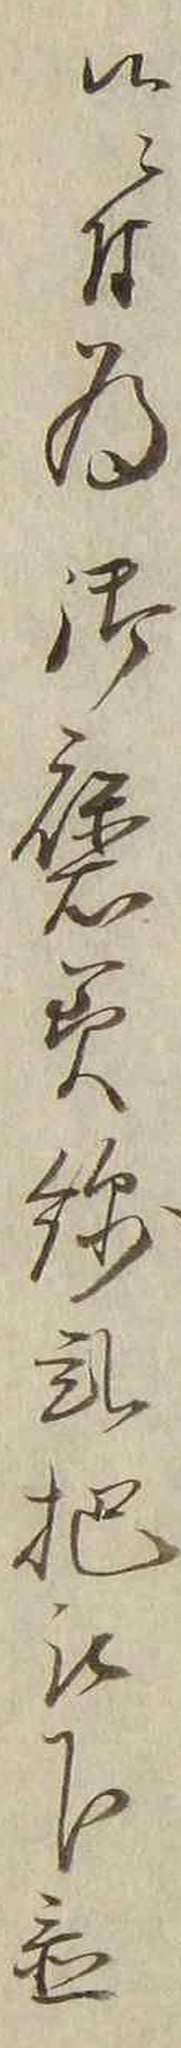候に付為御褒美綿弐把被下置

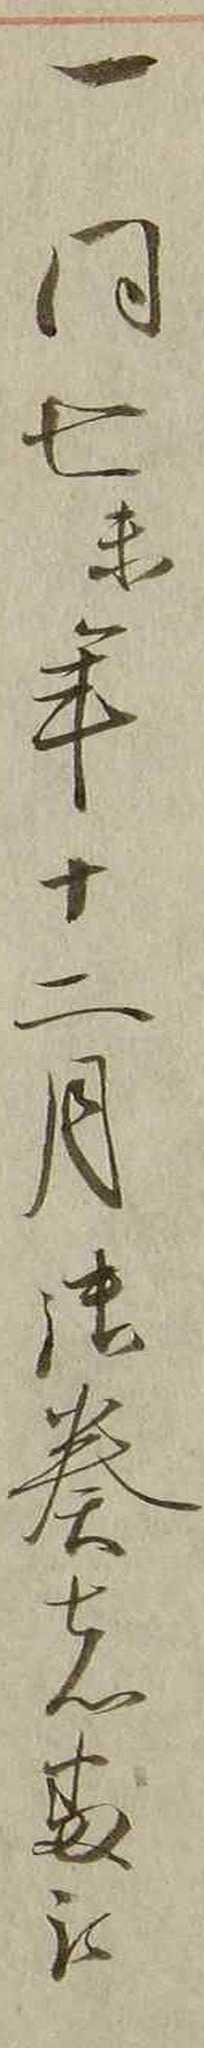一同七未年十二月御奏者番被
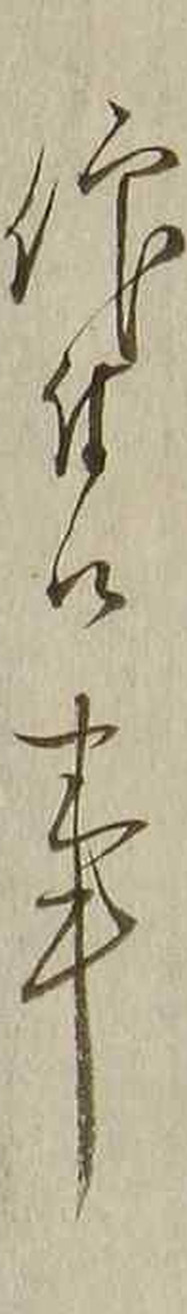仰付候事
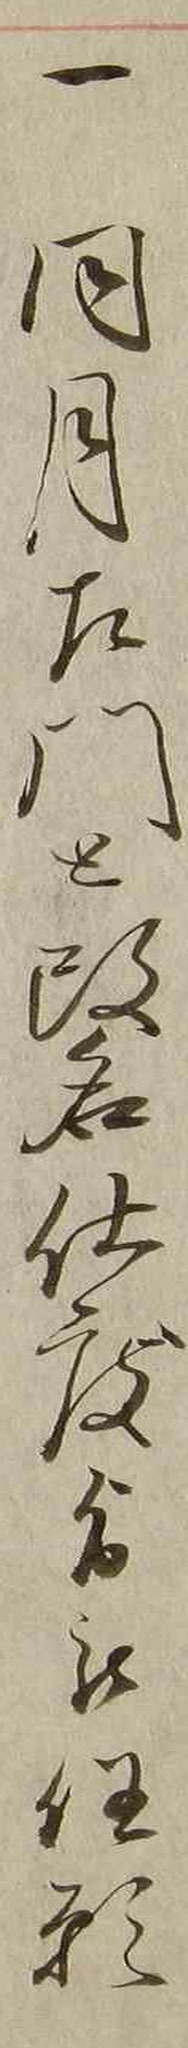一同月左門と改名仕度旨被任願
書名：諸士系譜　巻之103　か之部11
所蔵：会津若松市立会津図書館
